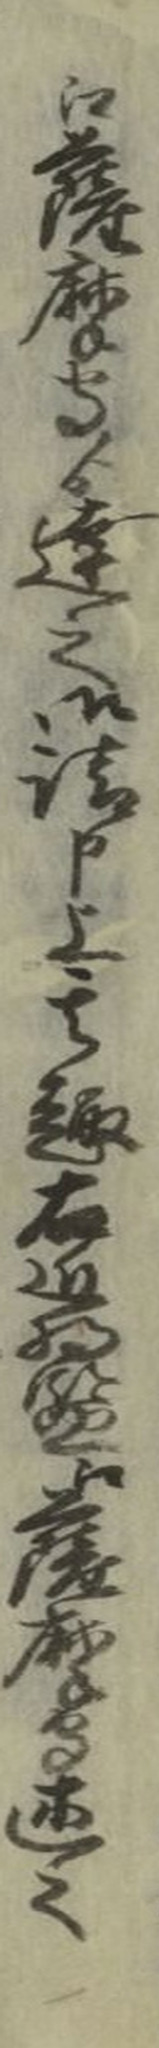え薩摩守ゟ達之御請申上其趣右近将監え薩摩守述之
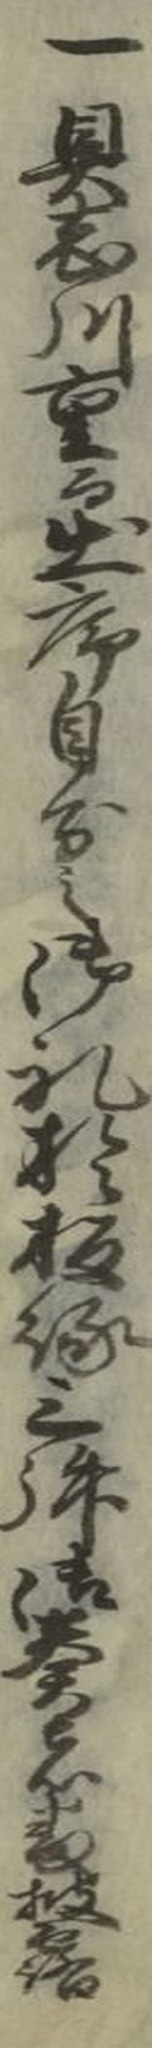一具志川重而出席自分之御礼於板縁三拝御奏者番披露
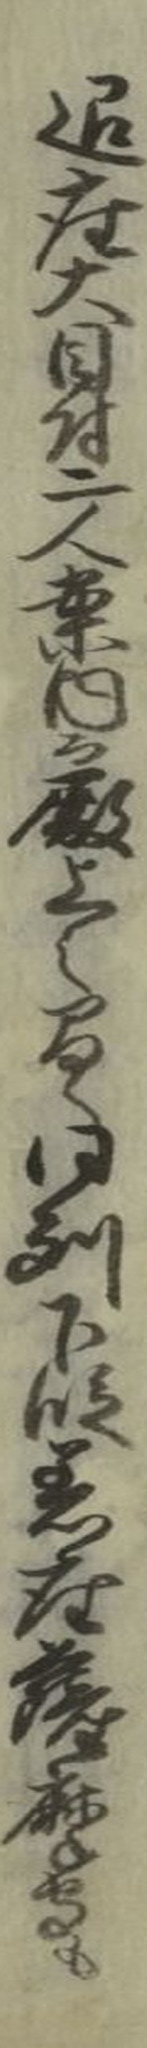退座大目付二人案内而殿上之間へ同列下段着座薩摩守も
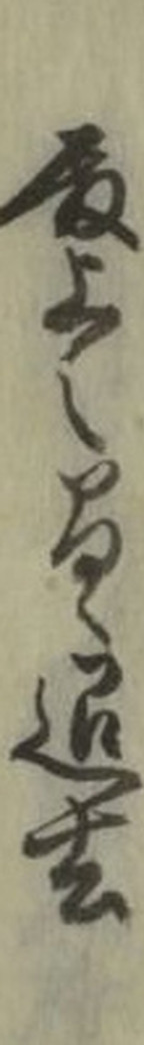殿上之間へ退去

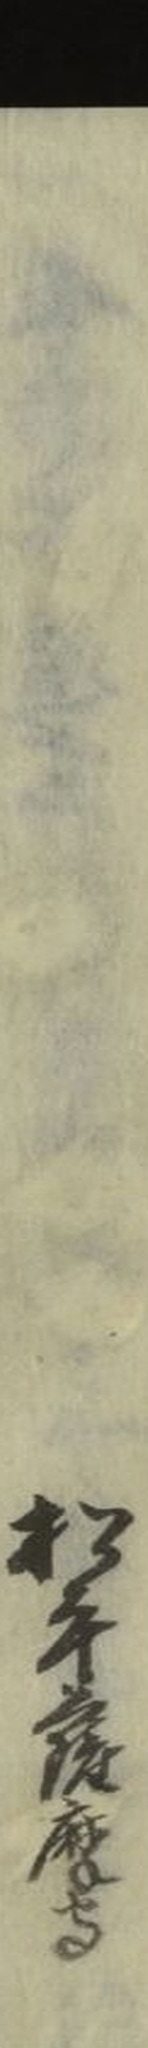松平薩摩守
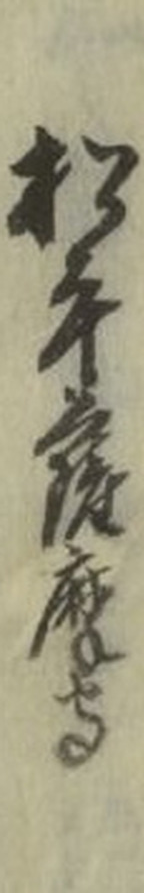松平薩摩守
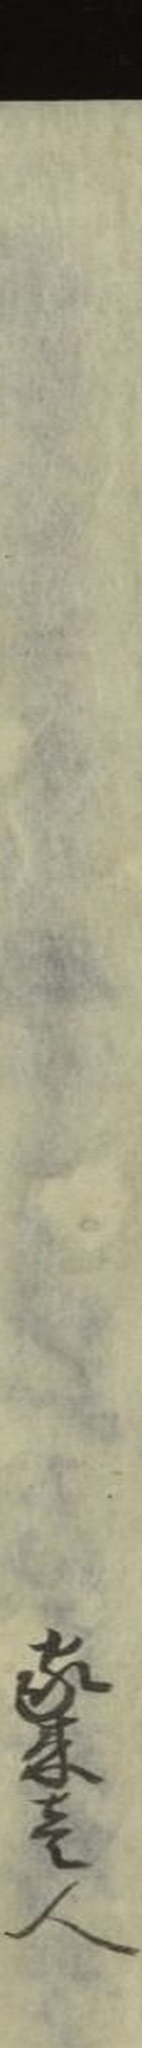家来一人
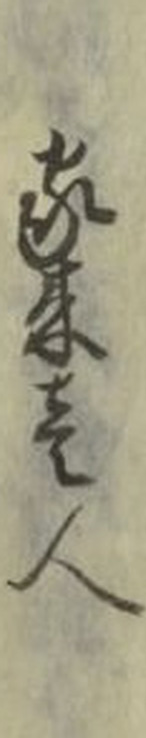家来一人
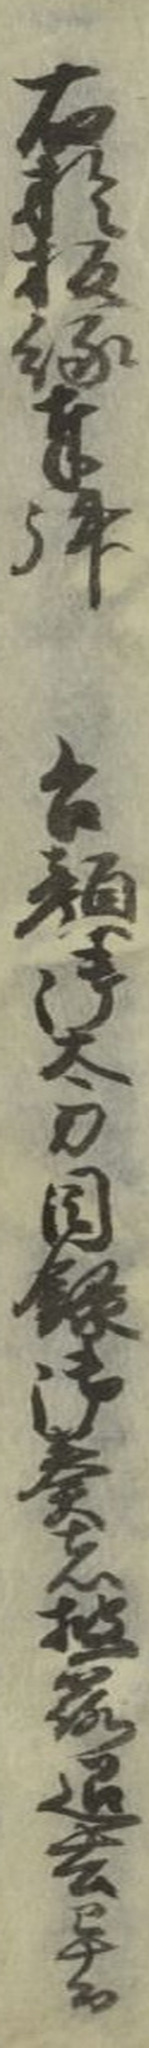右於板縁奉拝台顔御太刀目録御奏者番披露退去畢而
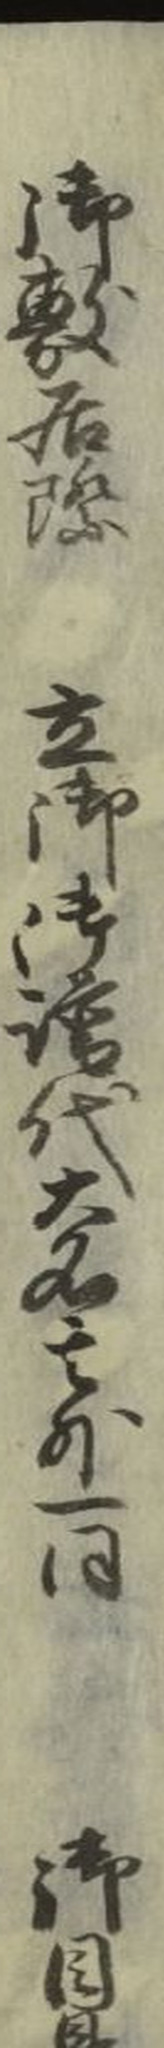御敷居際立御御譜代大名其外一同御目見相済
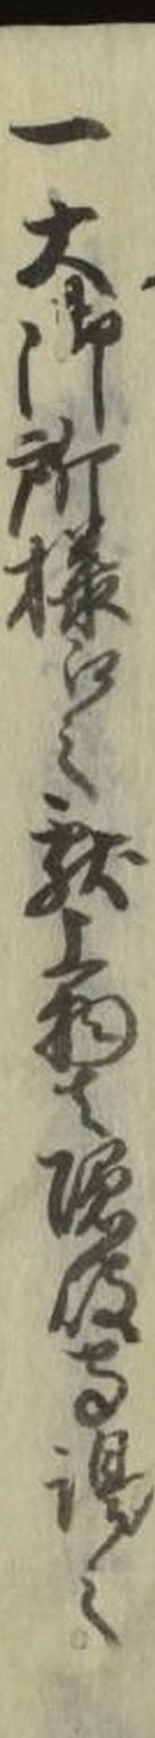一大御所様え之献上物は隠岐守謁之
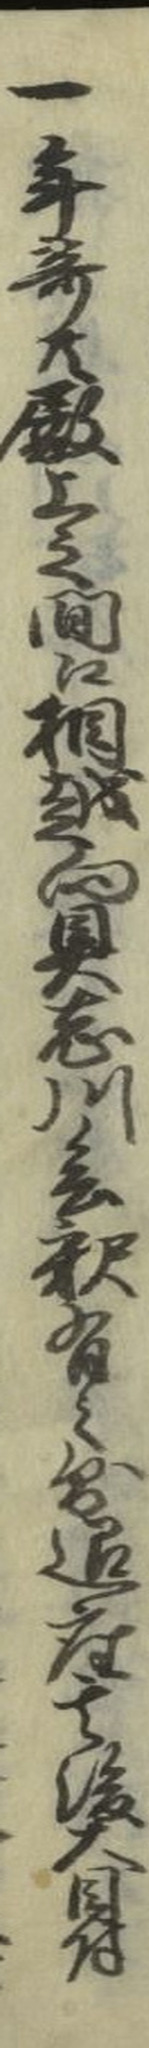一年寄共殿上之間え相越而具志川会釈有之則退座其後大目付
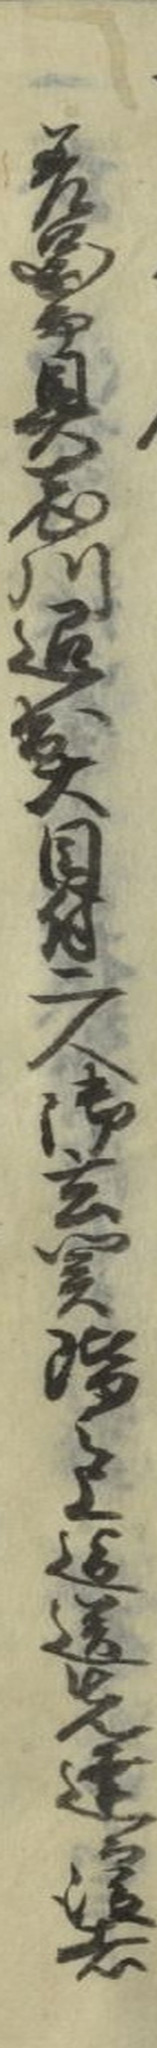差図而具志川退出大目付二人御玄関階之上迄送先達而従者
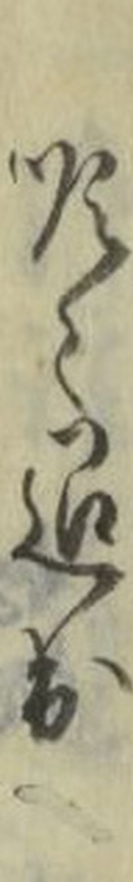順々退出
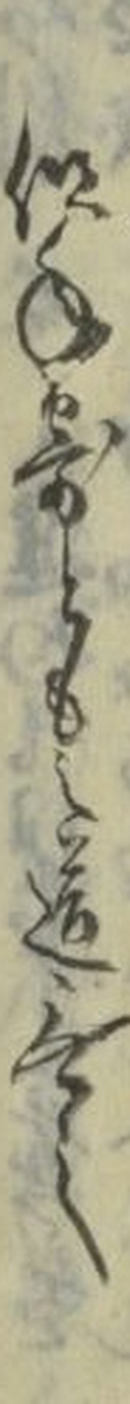但年寄とも之送無之
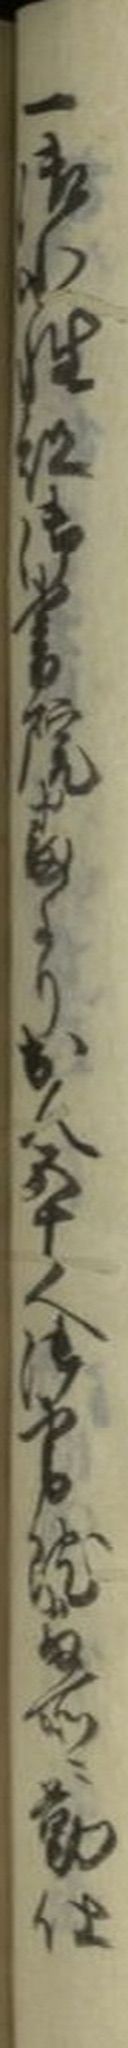一御小姓組御書院番より出人五十人御書院番所に勤任
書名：琉球人来朝之記
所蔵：University of the Ryukyus Library
